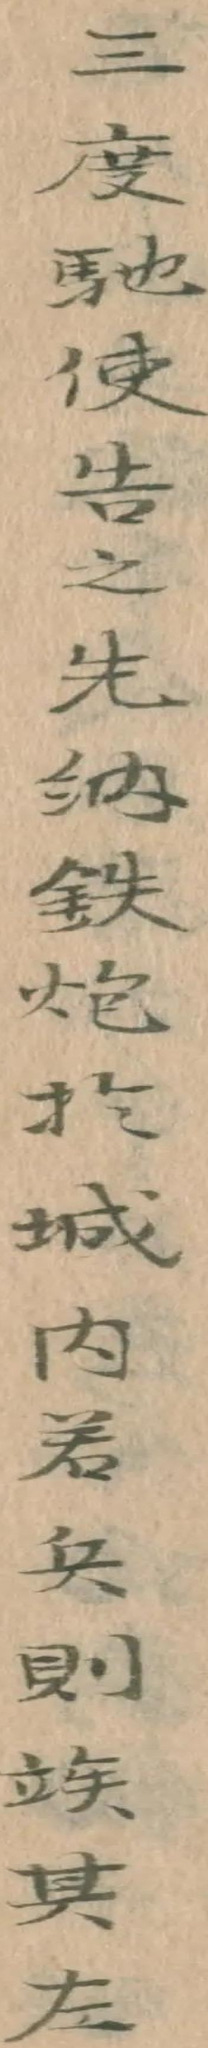三度馳使告之先納鉄炮於城内若兵則竢其左
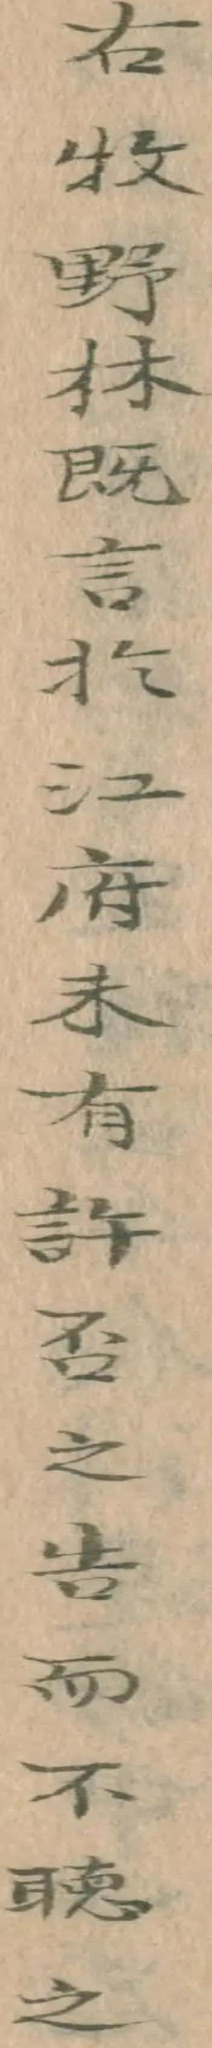右牧野林既言於江府未有許否之告而不聴之
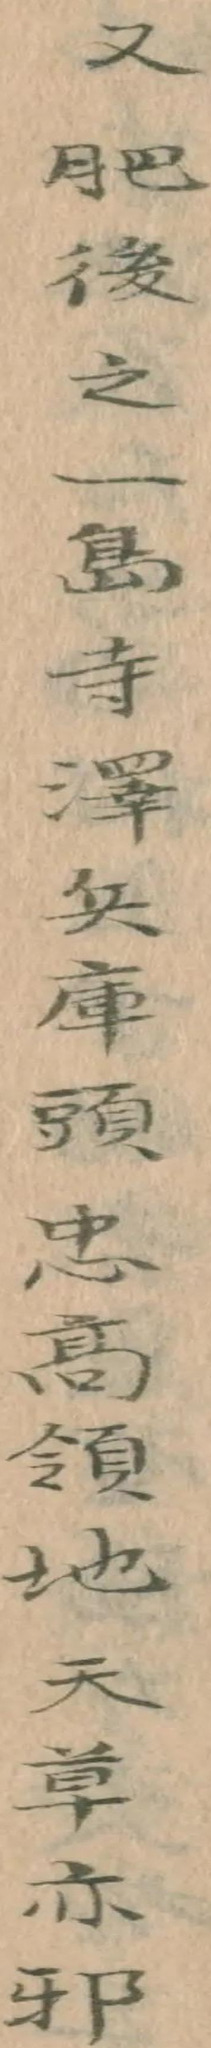又肥後之一島寺澤兵庫頭忠高領地天草亦邪
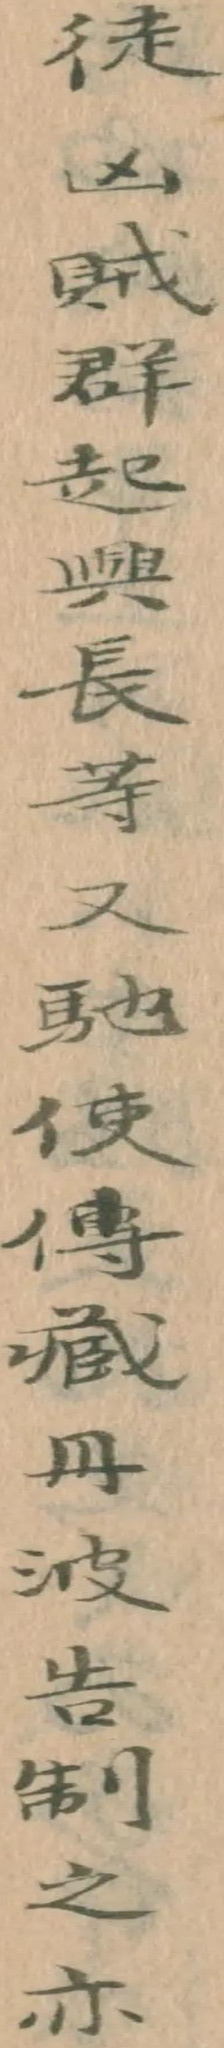徒凶賊群起興長等又馳使傳蔵丹羽告制之亦
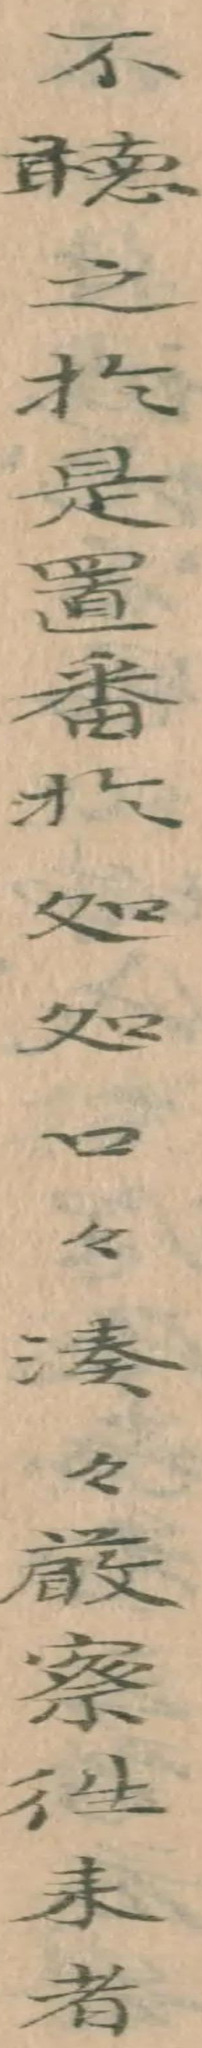不聴之於是置番於処処口々湊々厳察往来者
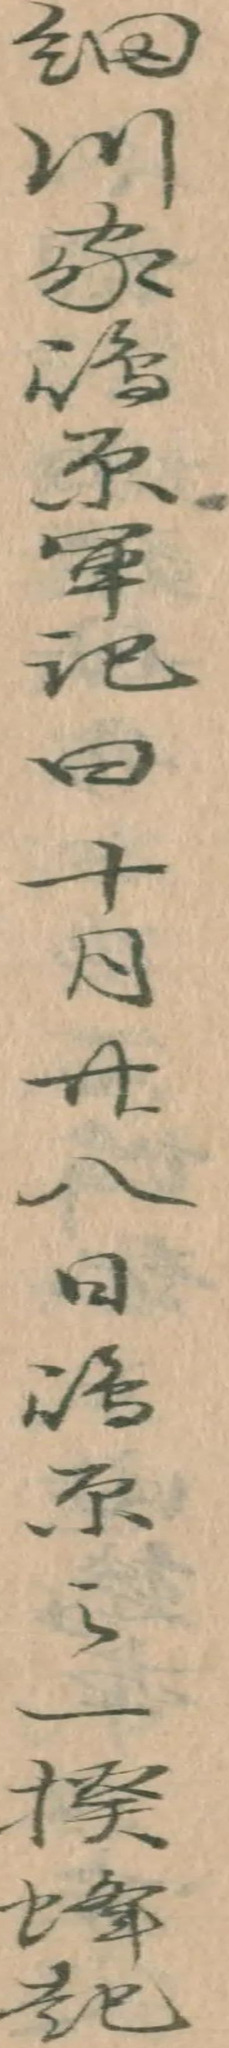細川家島原軍記曰十月廿八日島原之一揆蜂起
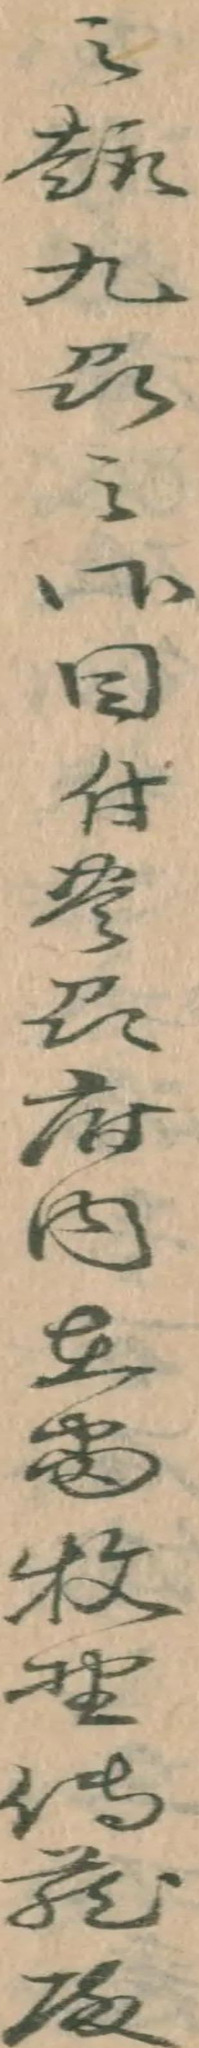之趣九州之御目付豊州府内在番牧野傳蔵殿
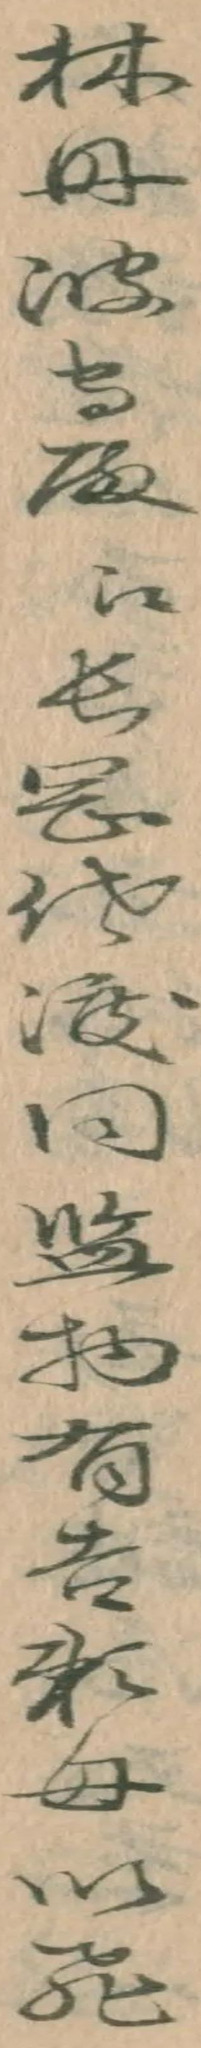林丹波守殿江長岡佐渡同監物有告頼母以飛
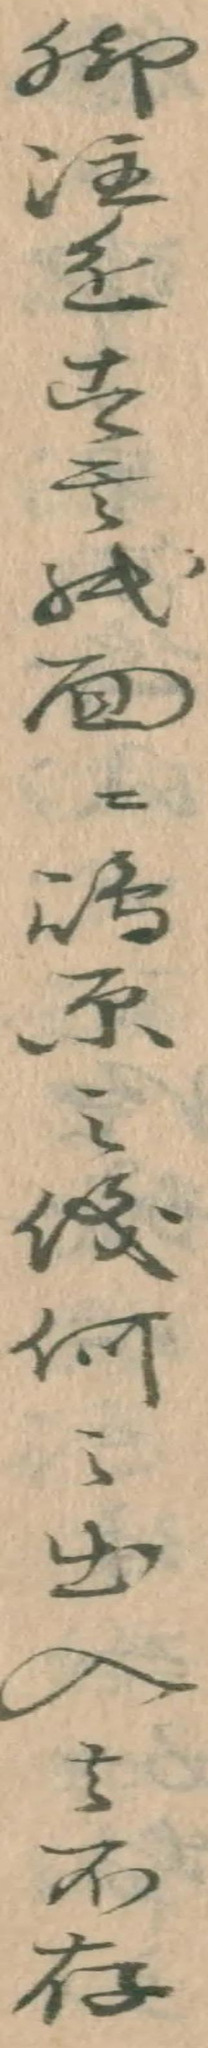脚注進春其紙面に島原之儀何之出入者不存
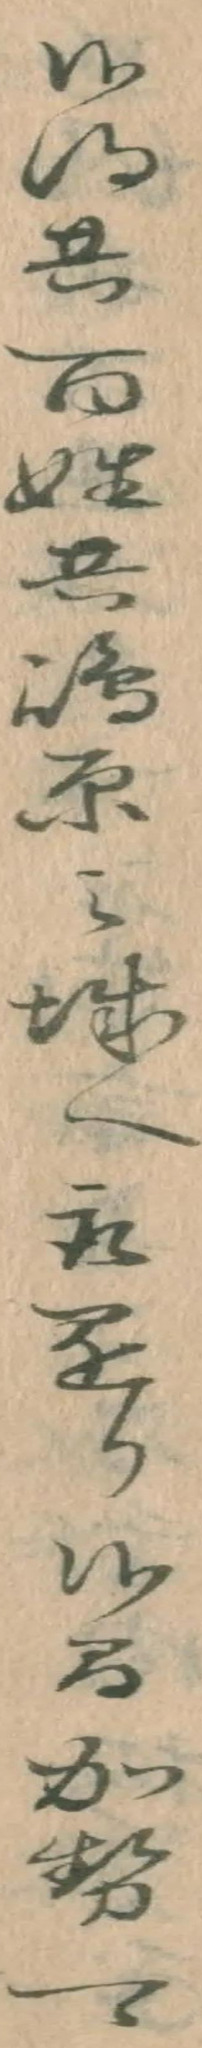候得共百姓共島原之城へ取懸り候間加勢可
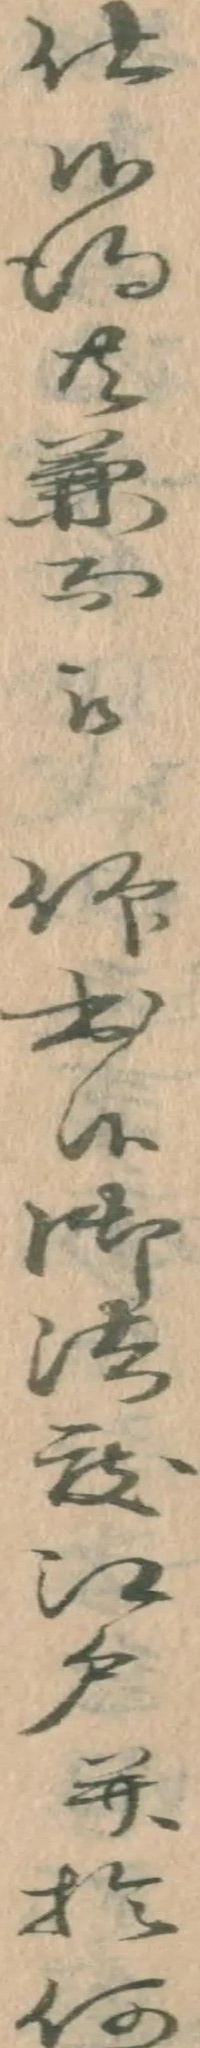仕候得共兼而被仰出候御法度江戸幷於何
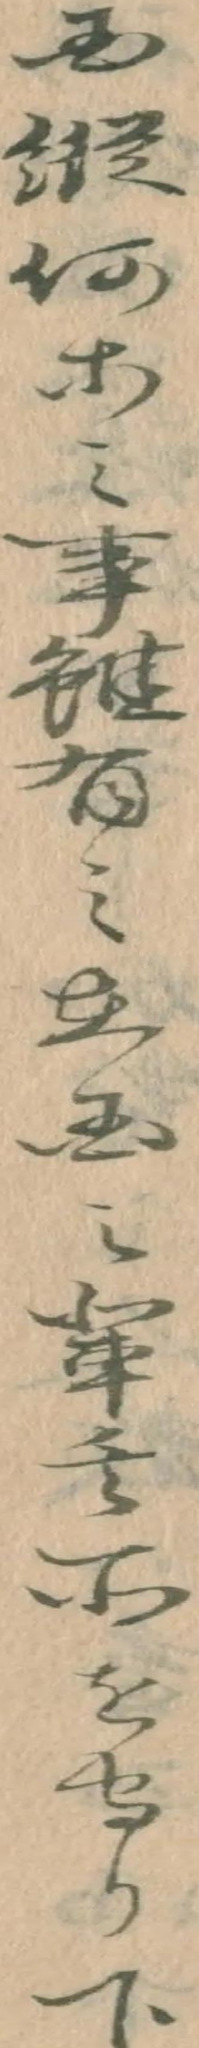国縦何等之事雖有之在国之輩其所を守り下
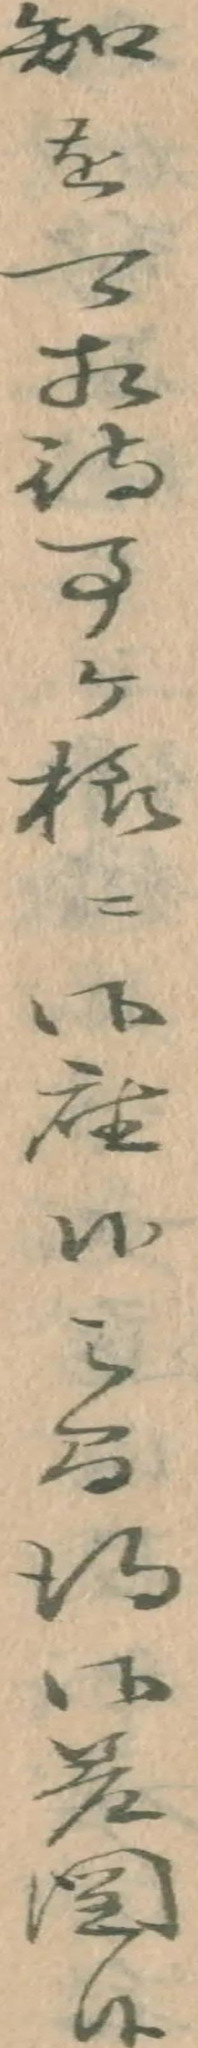知を可相待事け様に御座候之間得御差図候
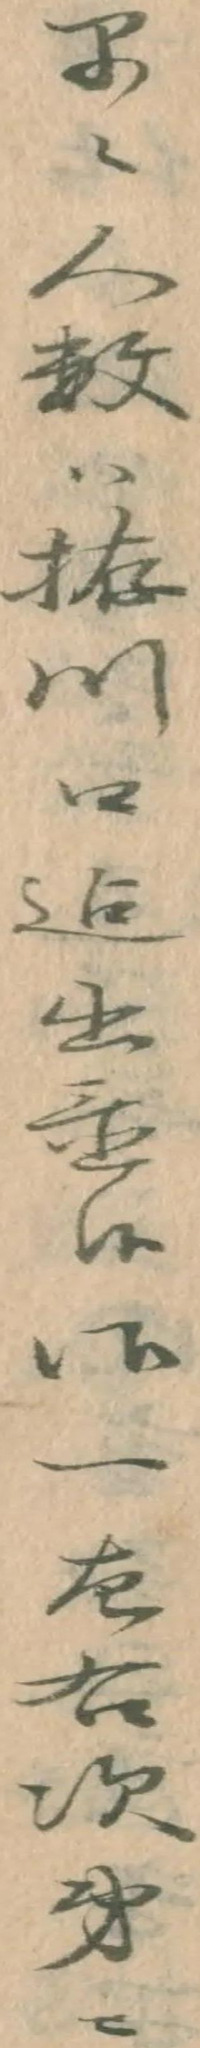早々人数は拵川口迄出置候御一左右次第に

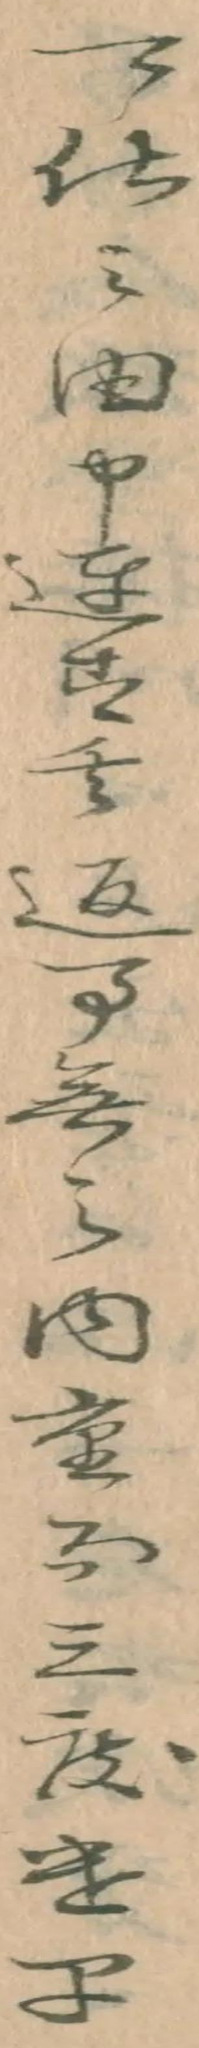可仕之由申達春其返事無之内重而三度遣早
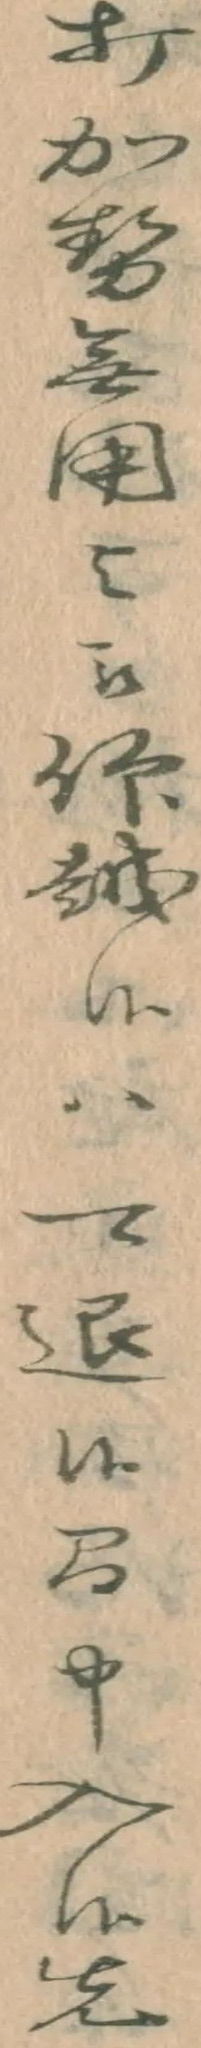打加勢無用与被仰越候は可退候間申入候先
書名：切支丹御退治記 49巻. [2]
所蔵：国立国会図書館 National Diet Library, JAPAN
